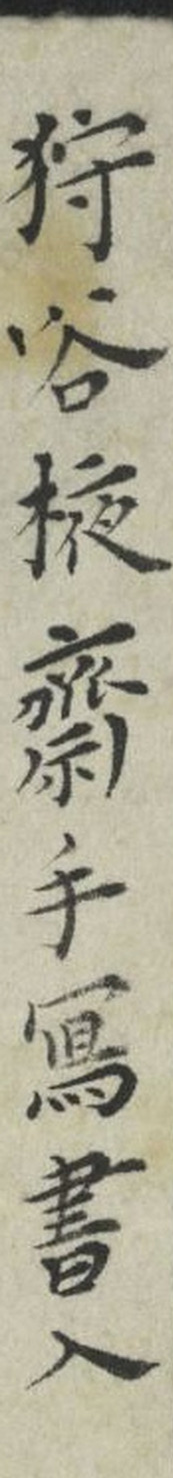狩谷棭齋手冩書入
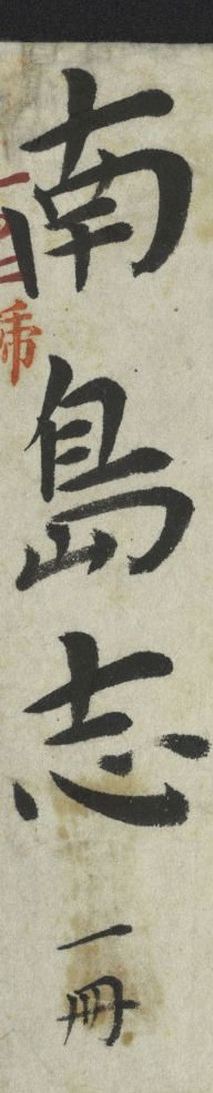南島志一冊

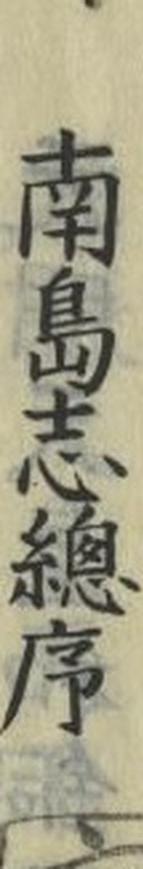南島志總序
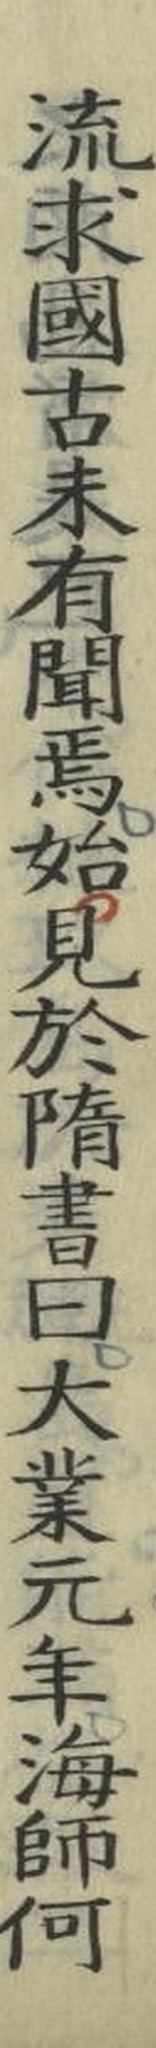流求國古未有聞焉。始見於隋書曰。大業元年海師何
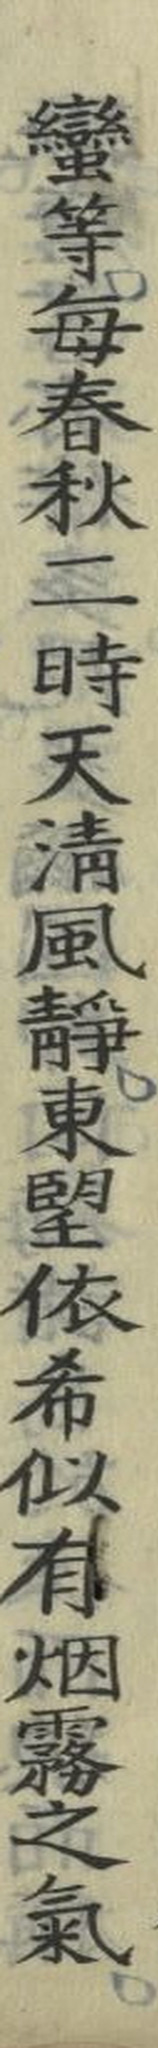蠻等。每春秋二時天淸風靜。東朢依希似有烟霧之氣。
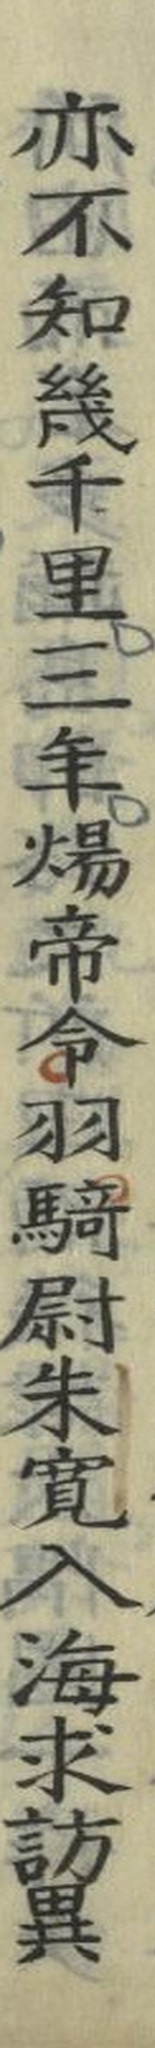亦不知幾千里。三年。煬帝令羽騎尉朱寛入海求訪異
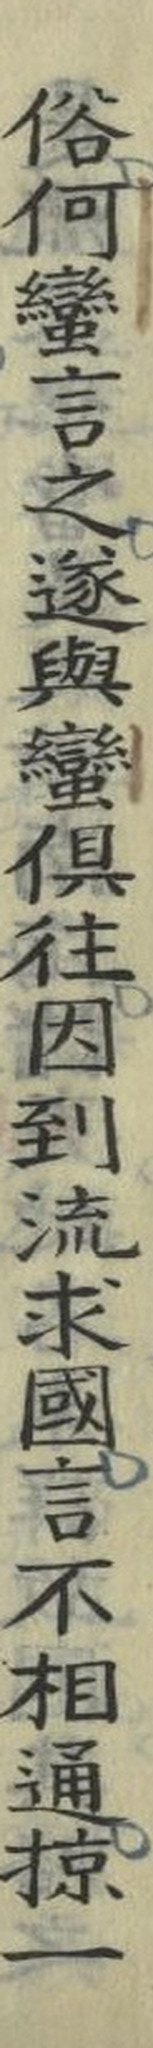俗。何蠻言之。遂與蠻俱往。因到流求國。言不相通。掠一
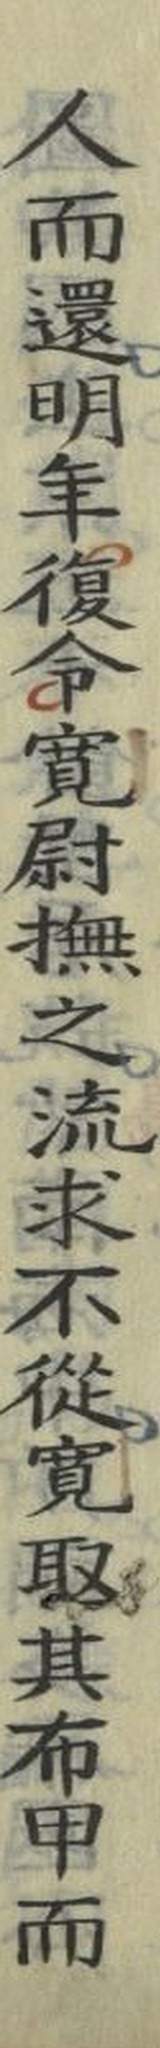人而還。明年復令寛尉撫之。流求不從。寛取其布甲而
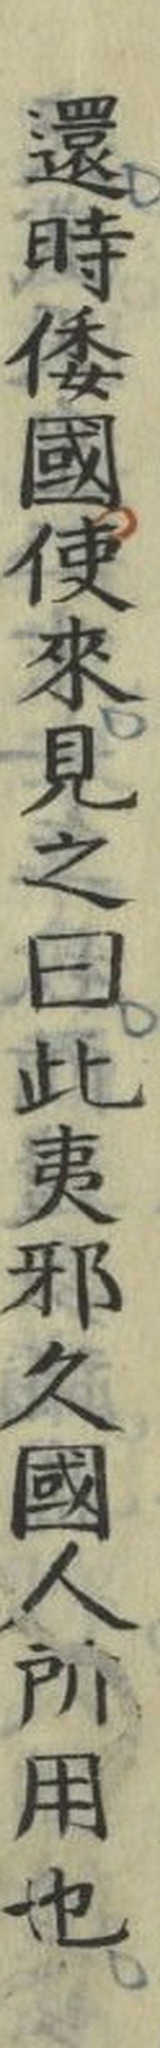還。時倭國使來。見之曰。此夷邪久國人所用也。
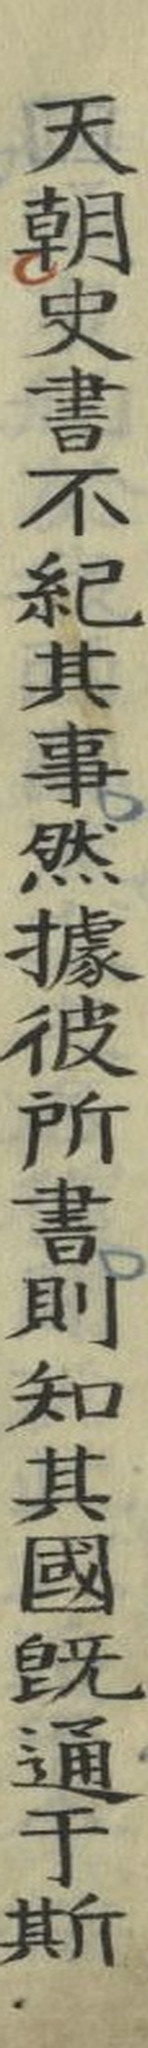天朝史書不紀其事。然據彼所書。則知其國既通于斯
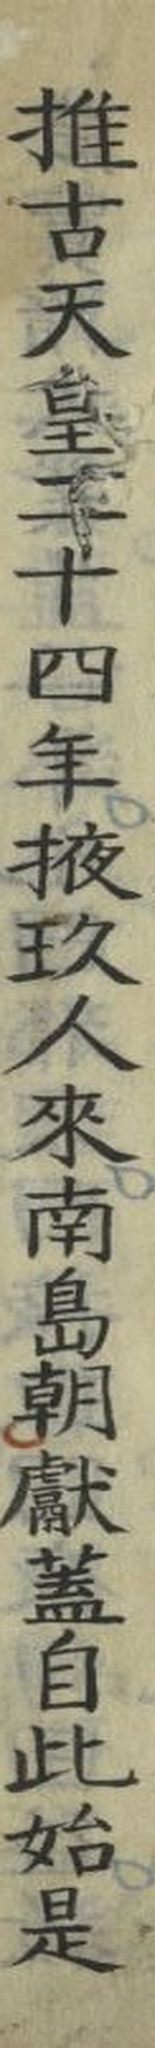推古天皇二十四年。掖玖人來。南島朝獻蓋自此始是

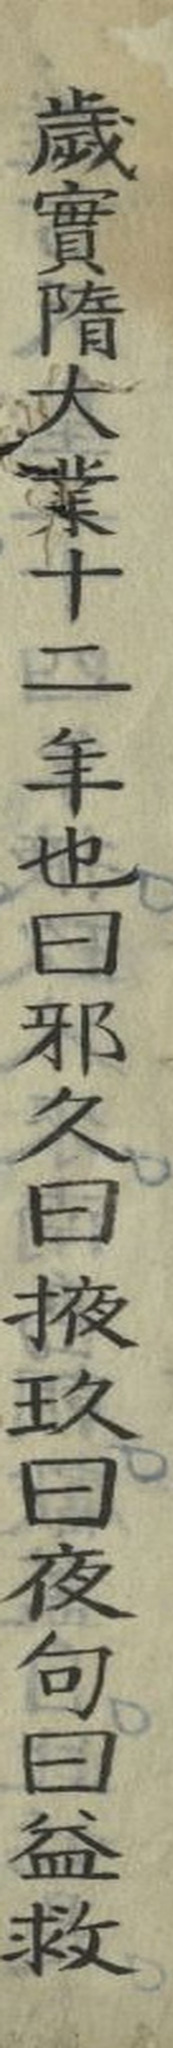歲實隋大業十二年也。曰邪久。曰掖玖。曰夜句。曰益救。
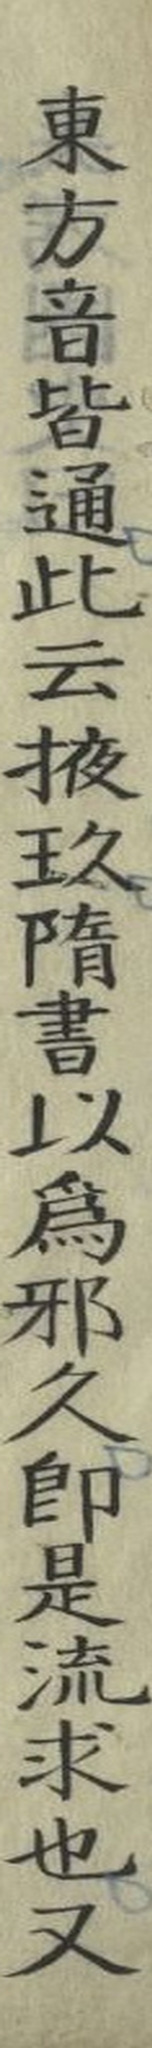東方音皆通。此云掖玖。隋書以爲邪久。卽是流求也。又
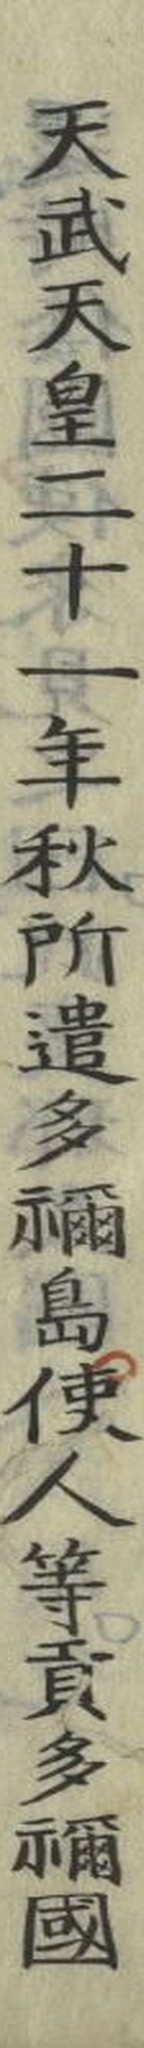天武天皇二十一年秋。所遣多禰島使人等。貢多禰國
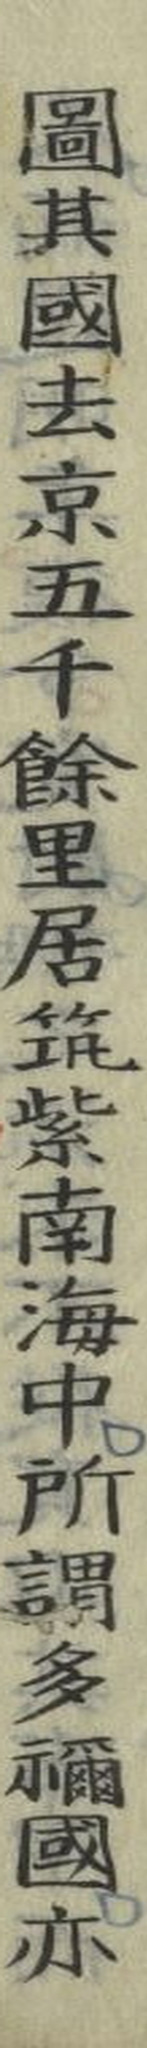圖。其國去京五千餘里。居筑紫南海中。所謂多禰國。亦
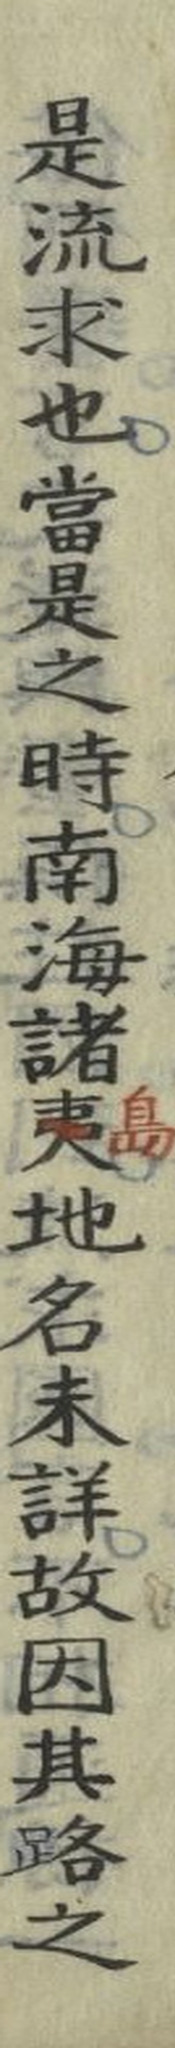是流求也。當是之時。南海諸夷島。地名未詳。故因其路之
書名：南島志
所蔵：University of the Ryukyus Library
